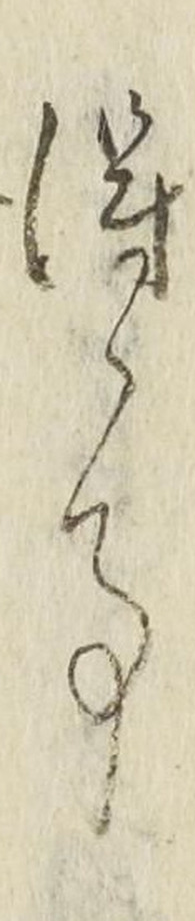得候事
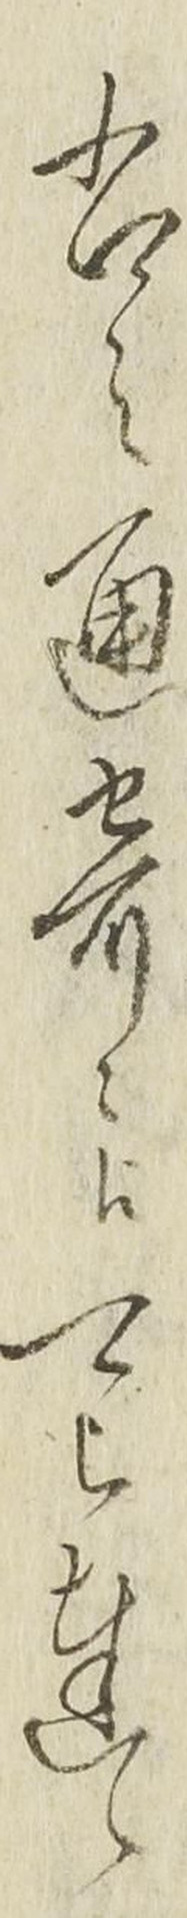右之通寄々え可被達候
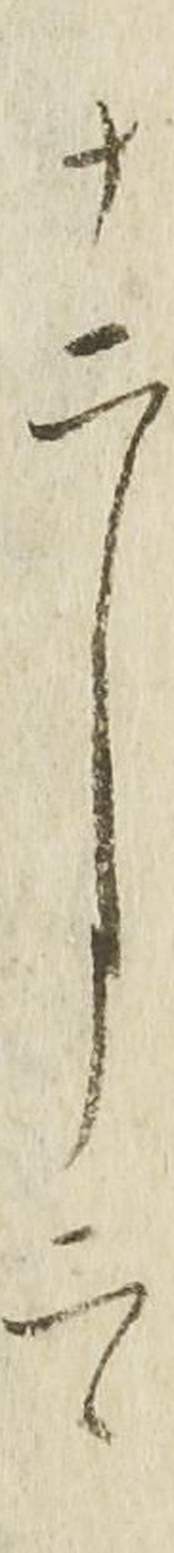十二月二日
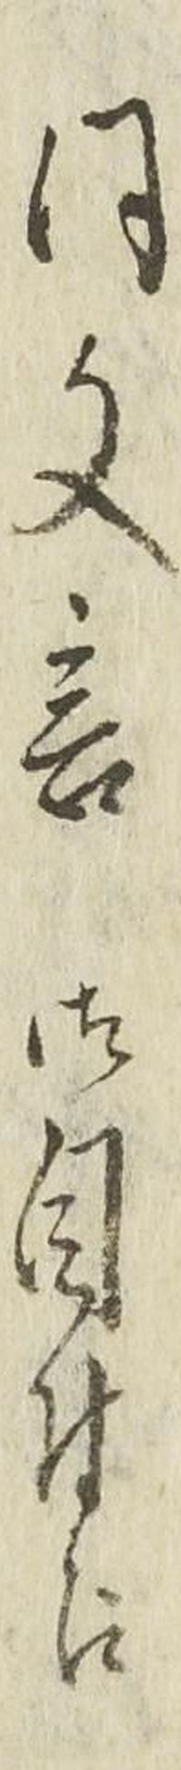同文言御目付え
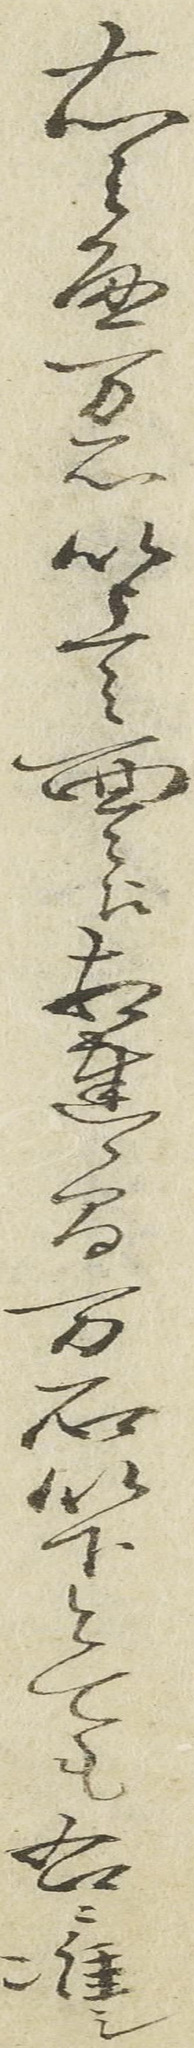右之通万石以上之面々え相達候間万石以下とても右ニ准シ
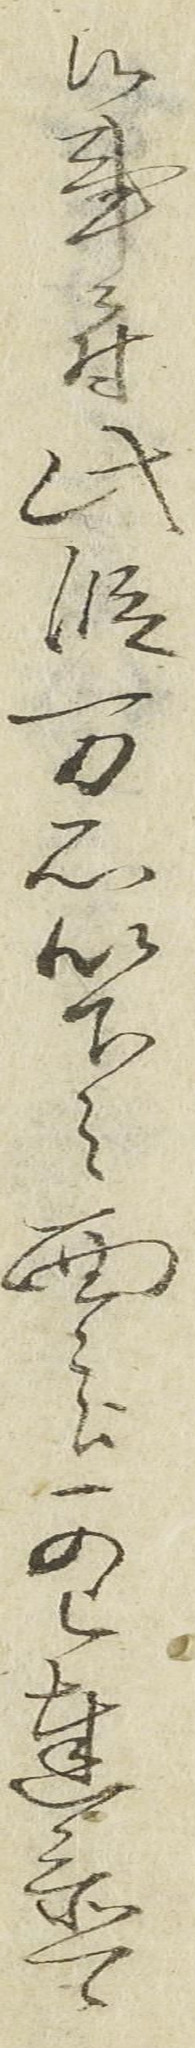候事ニ付此段万石以下之面々え可被達置候

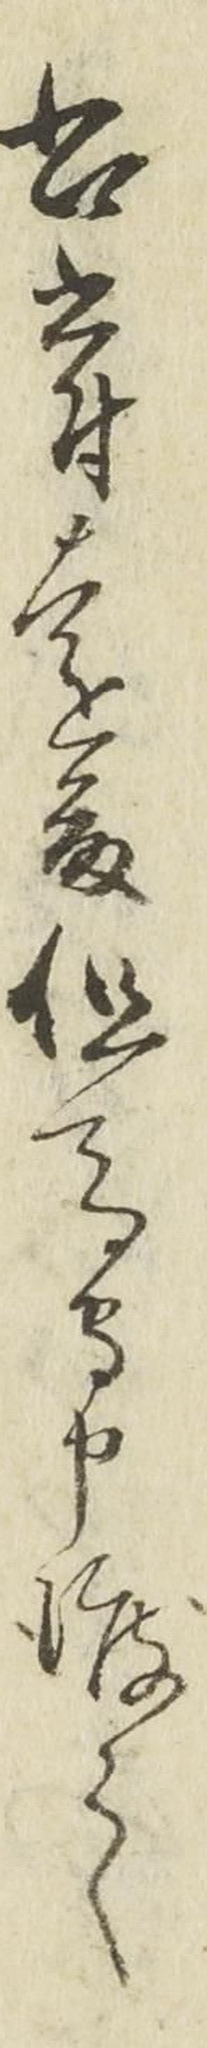右書付遠藤但馬守申渡之
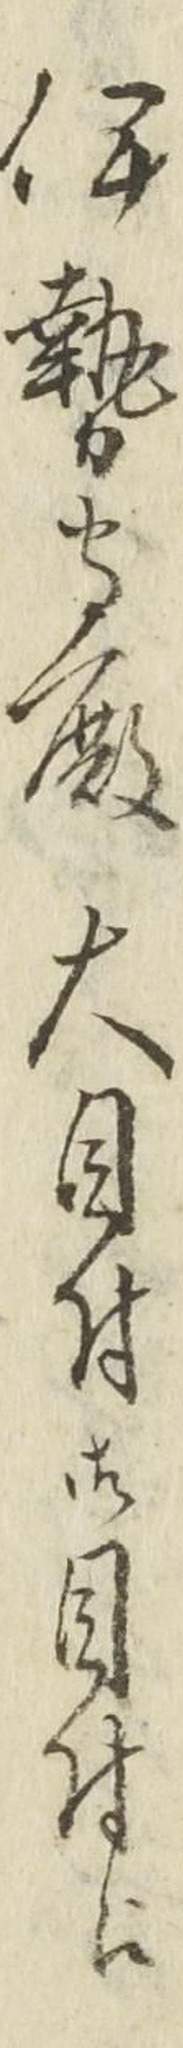伊勢守殿大目付御目付え
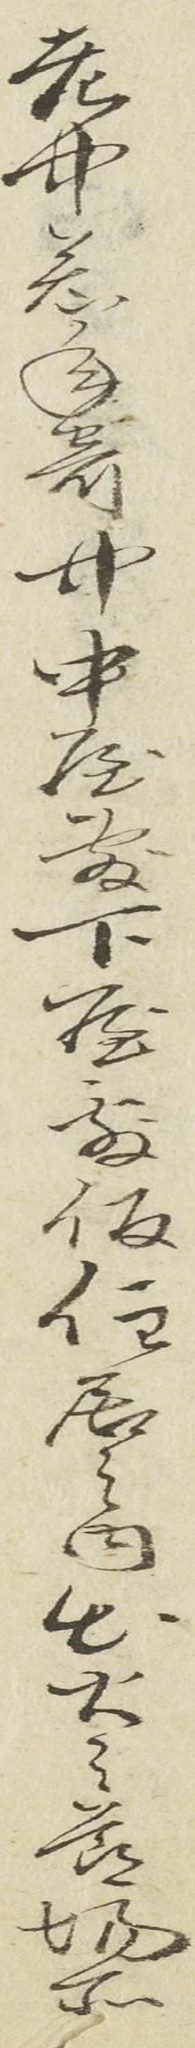老中若年寄中中屋敷下屋敷下屋敷仮住居之内出火之節場所
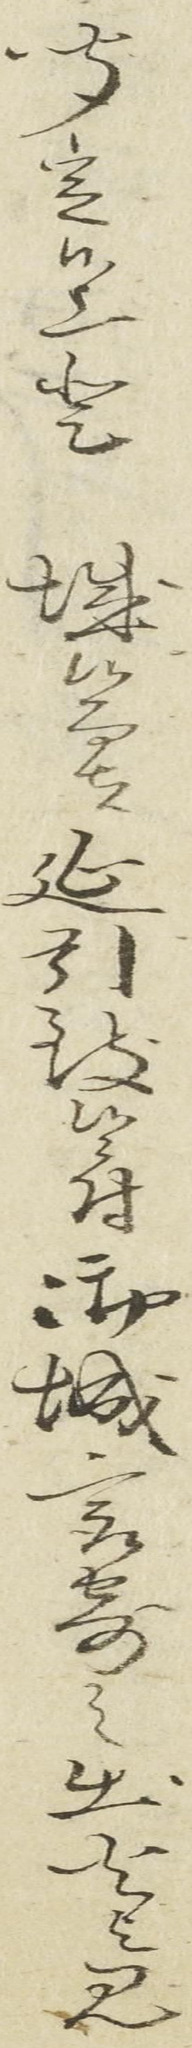聞定候上登城候而は延引致候ニ付御城最寄之出火と見
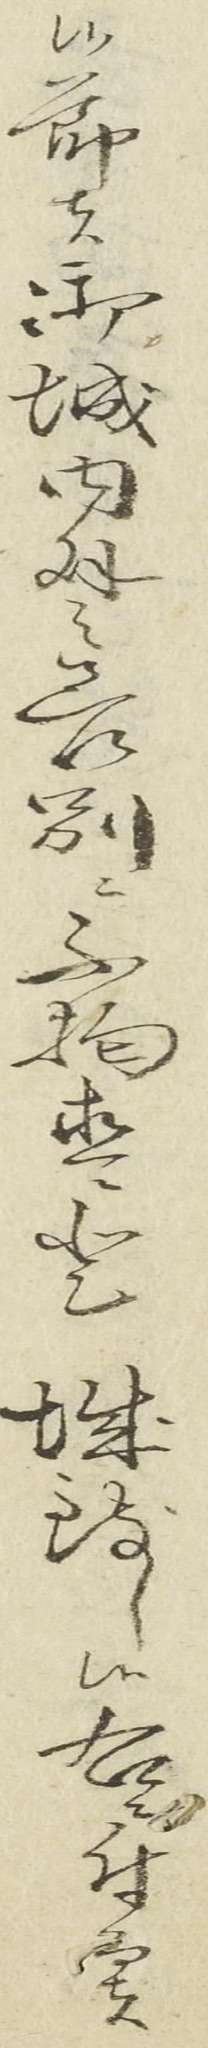候節は御城内外之差別ニ不拘直ニ登城致し候右ニ付而は
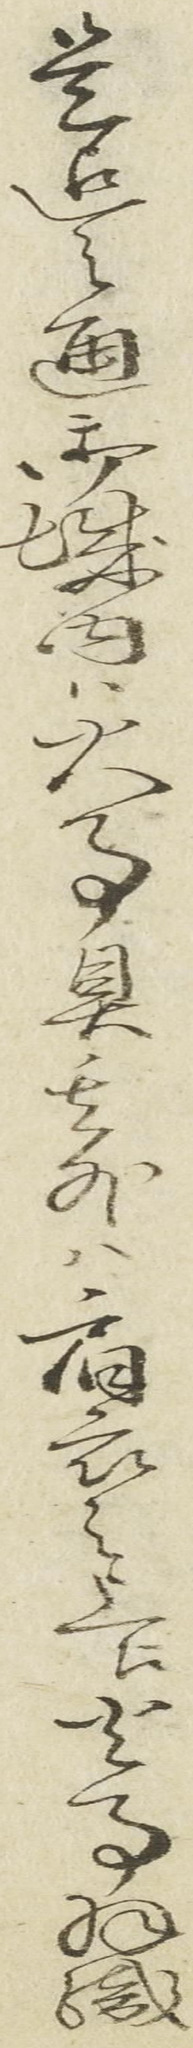是迄之通御城内ハ火事具其外ハ肩衣之上え火事羽織
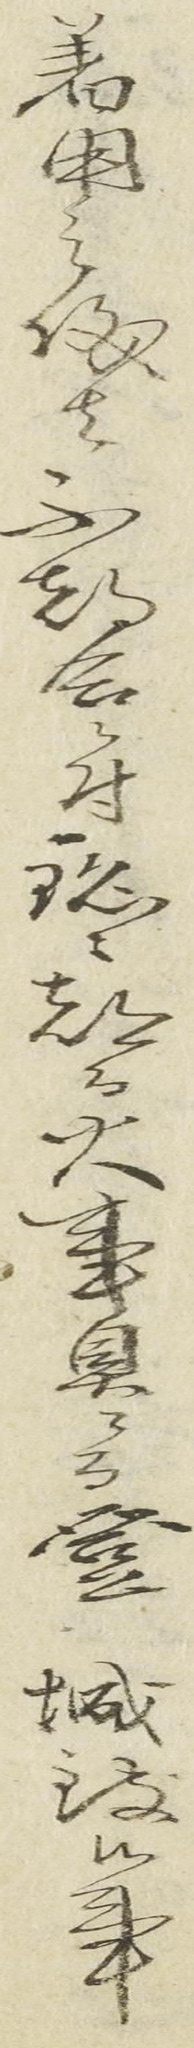着用之儀は不都合ニ付銘々都而火事具ニ而登城致候事
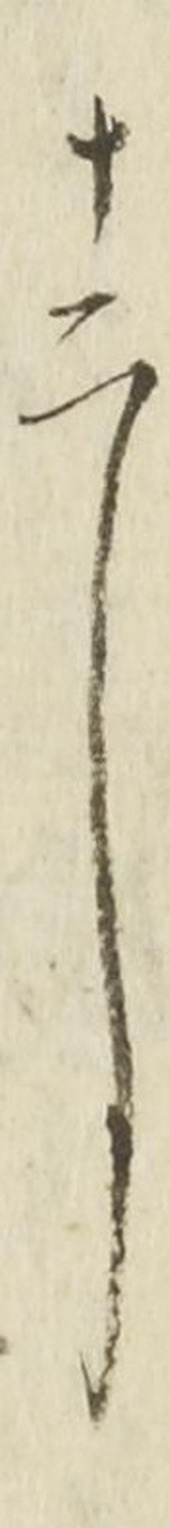十二月
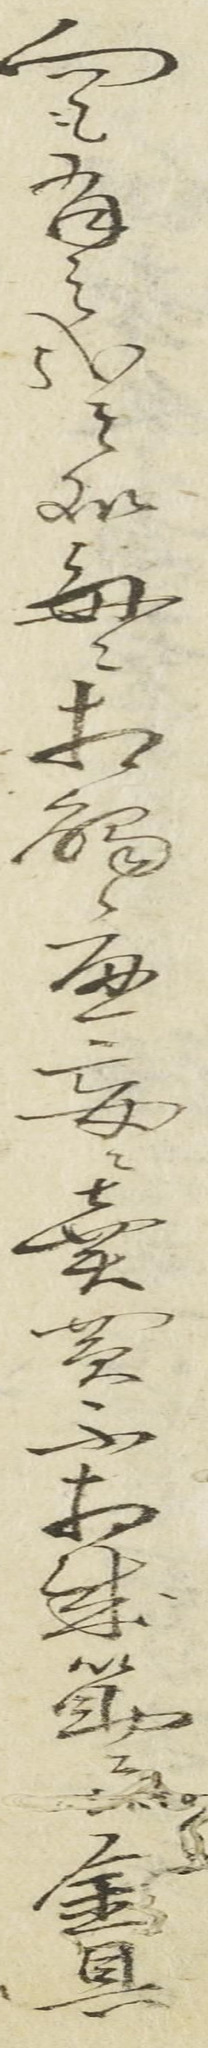向も有之哉之処毎々相触候通妄二売買不相成筋ニ而金具
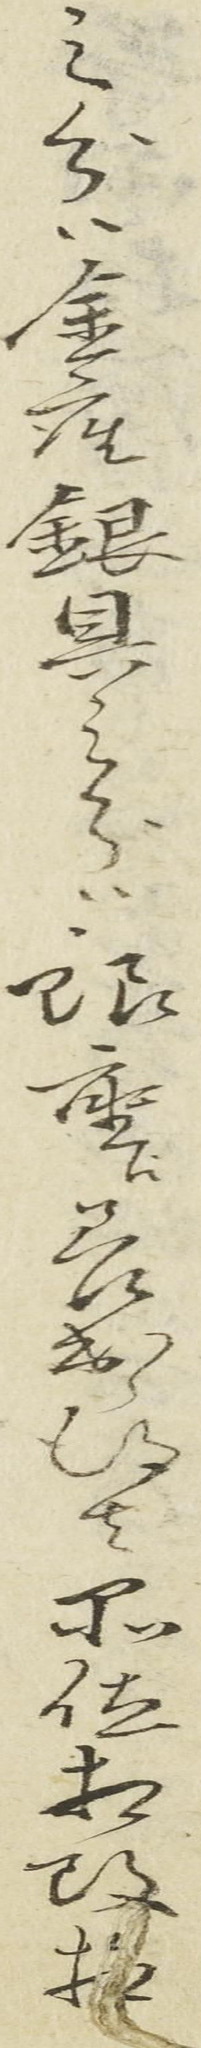之分ハ金座銀具之分ハ銀座え差出候得は品位相改相
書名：安政二乙卯年十月二日大地震之事
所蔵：東京大学地震研究所図書室 Earthquake Research Institute Library, The University of Tokyo, JAPAN
